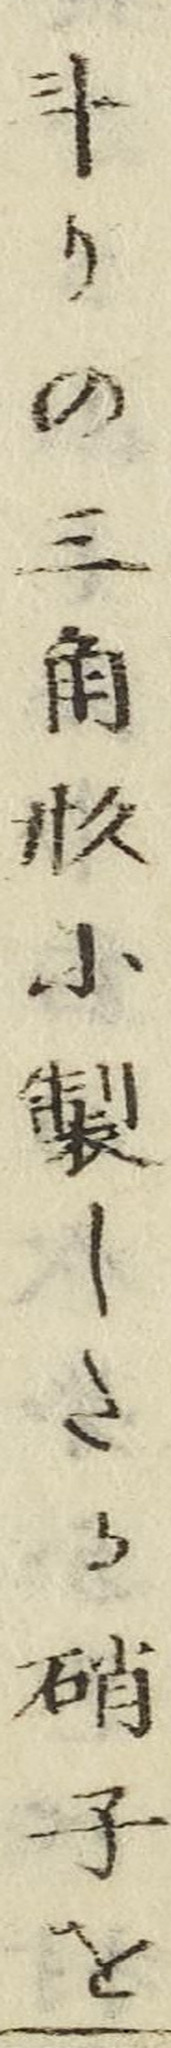斗りの三角形に製したる硝子を
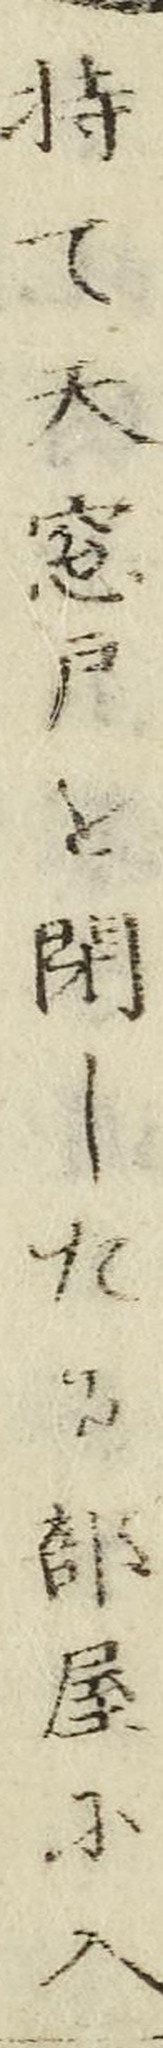持て天窓戸を閉したる部屋に入
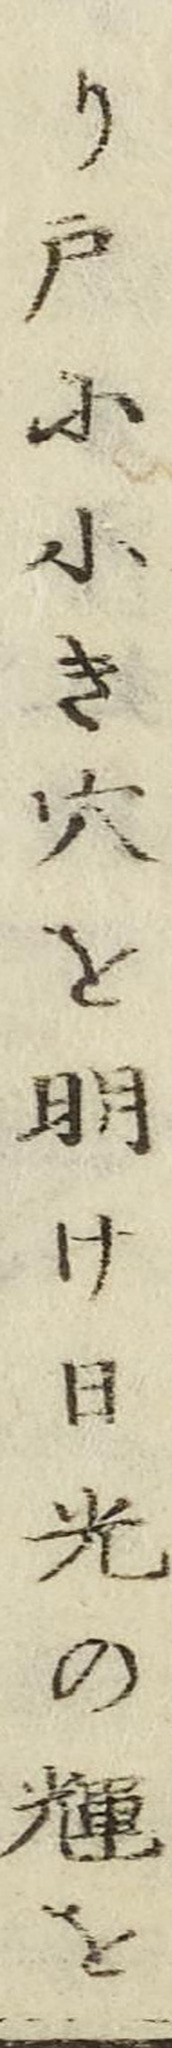り戸に小き穴を明け日光の輝を
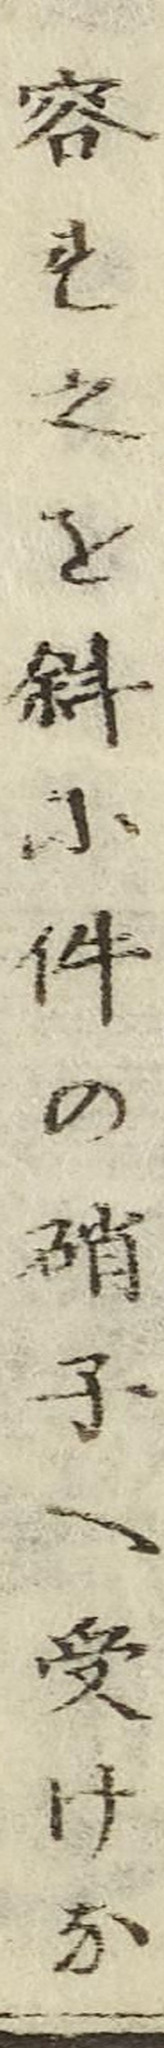容れ之を斜に件の硝子へ受けな
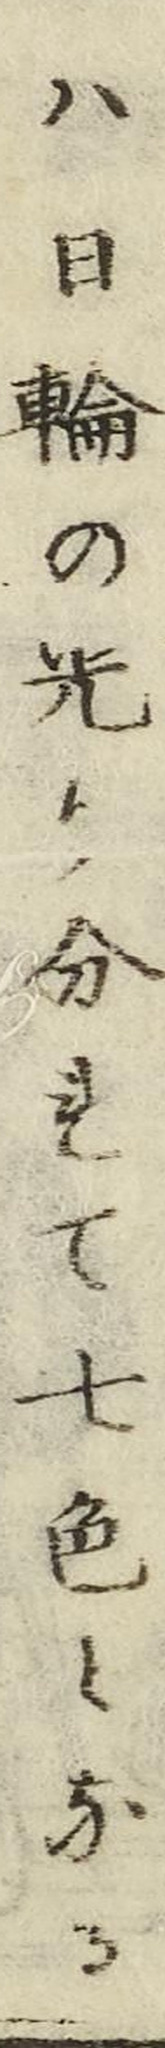は日輪の光り分れて七色となる
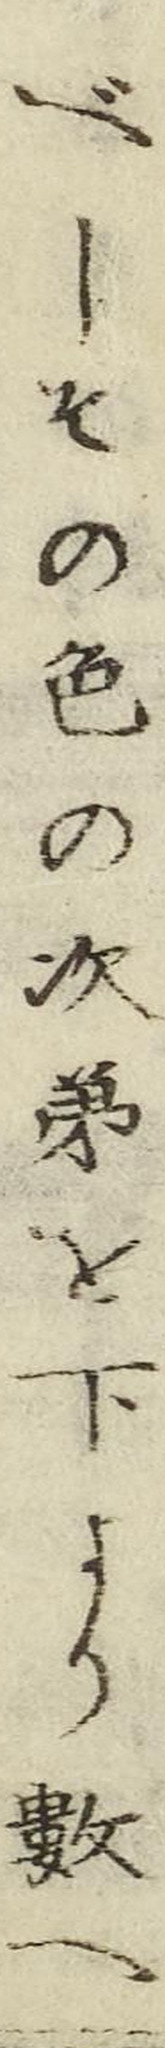べしその色の次第を下より数へ
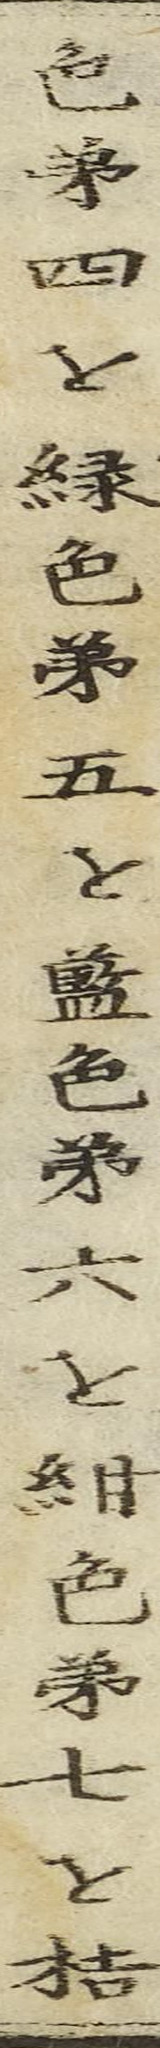色第四を緑色第五を藍色第六を紺色第七を桔

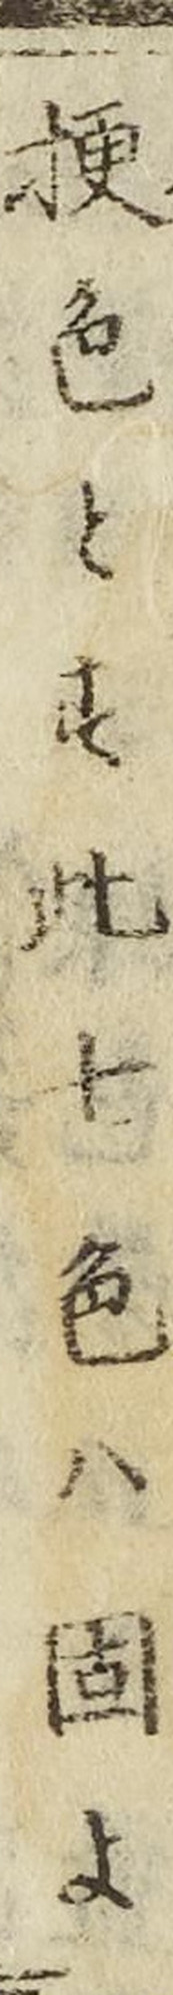梗色とす此七色は固よ
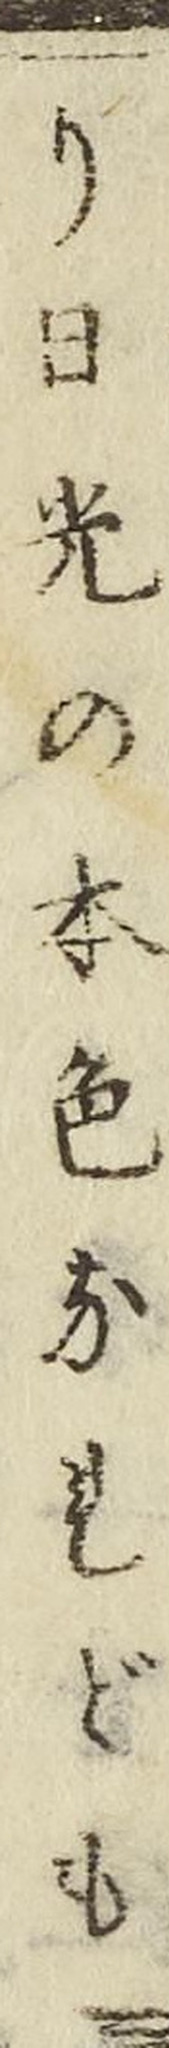り日光の本色なれども
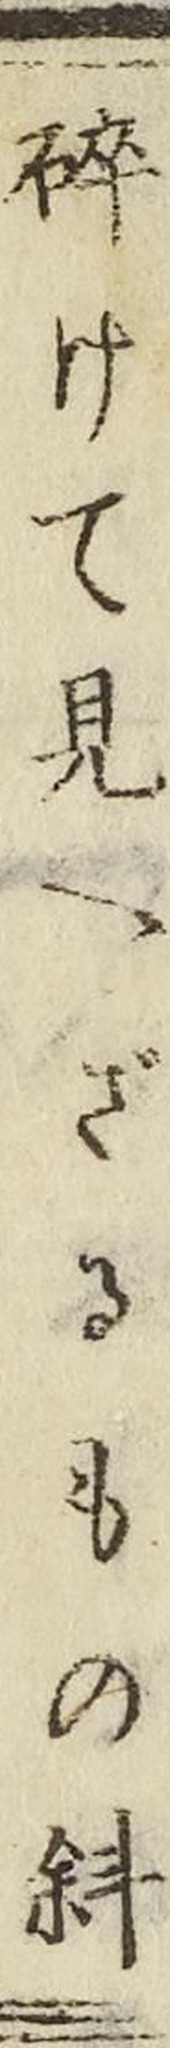砕けて見へざるもの斜
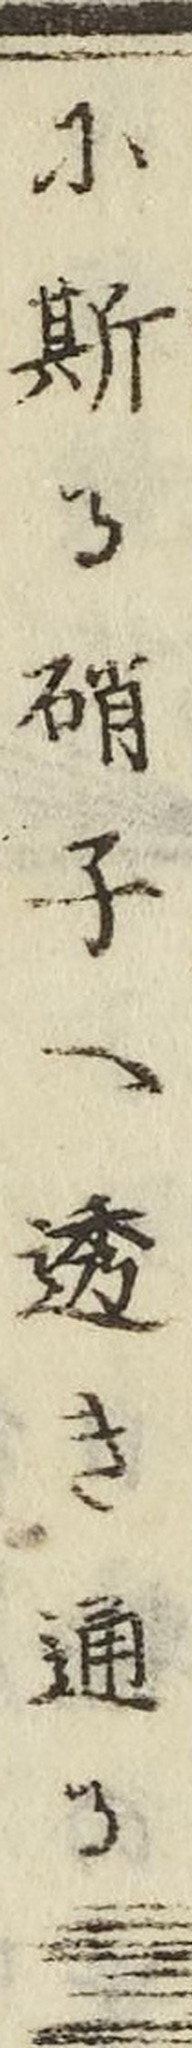に斯る硝子へ透き通る
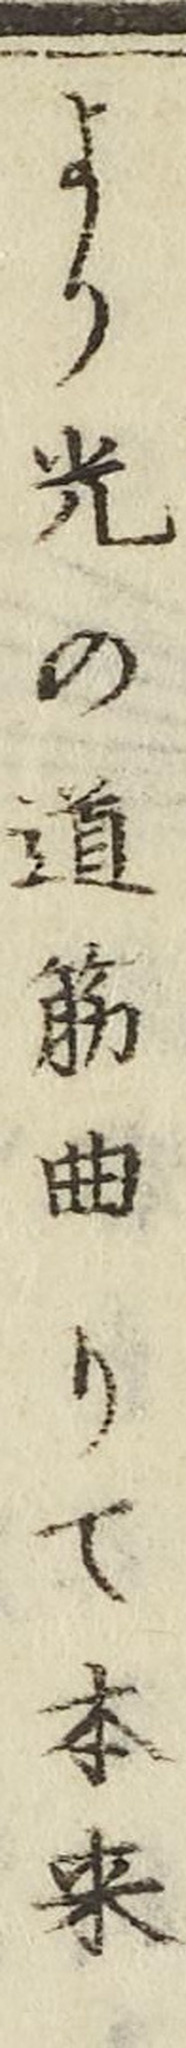より光の道筋曲りて本来
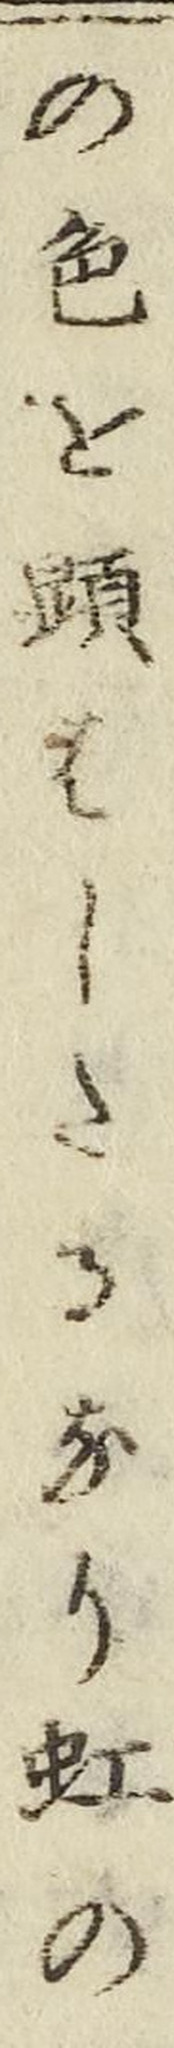の色を顕はしたるなり虹の
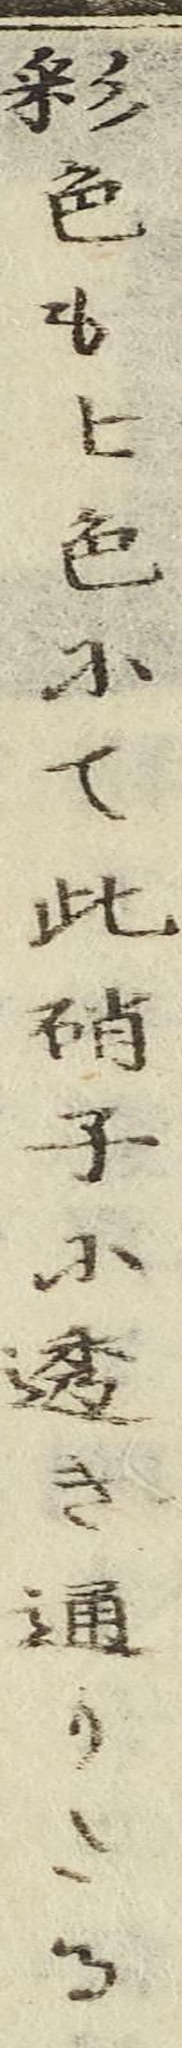彩色も七色にて此硝子に透き通りたる
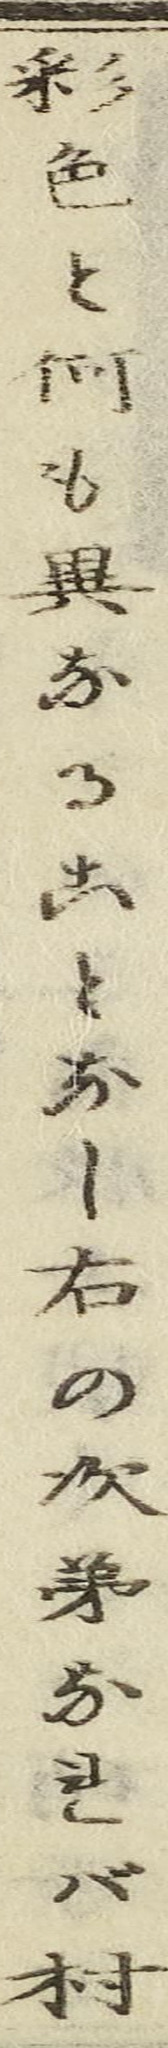彩色と何も異なることなし右の次第なれば村
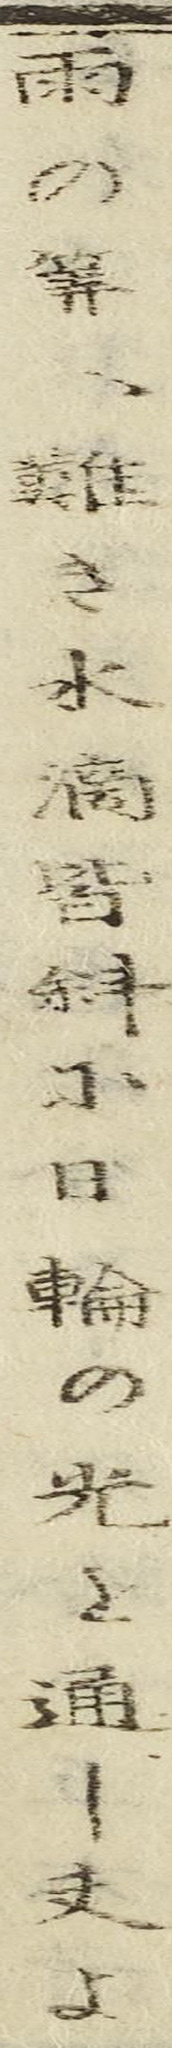雨の算へ難き水滴皆斜に日輪の光を通し夫よ
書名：天変地異
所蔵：東京大学地震研究所図書室 Earthquake Research Institute Library, The University of Tokyo, JAPAN
